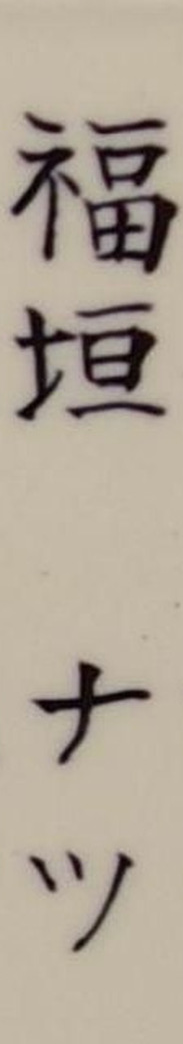福垣ナツ
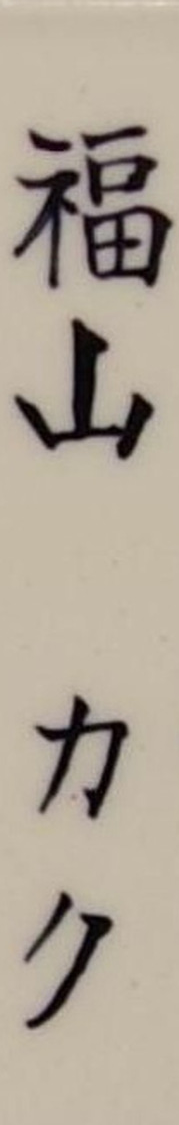福山カク
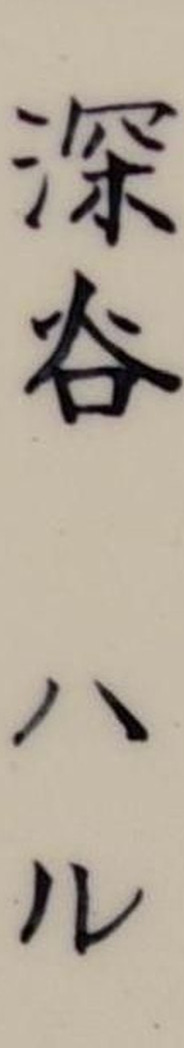深谷ハル
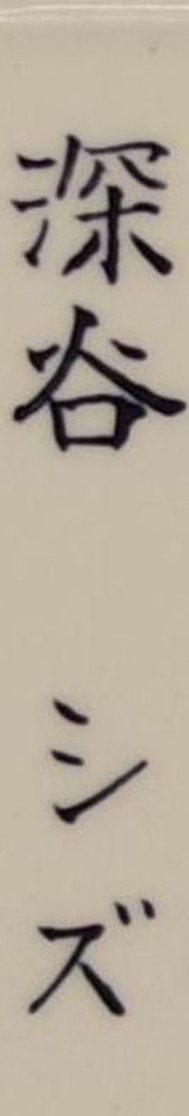深谷シズ
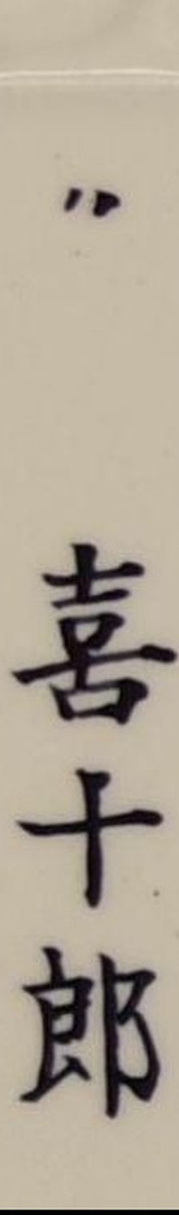喜十郎
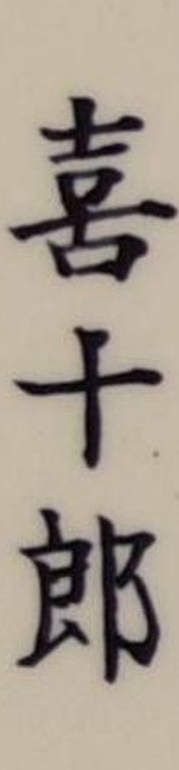喜十郎
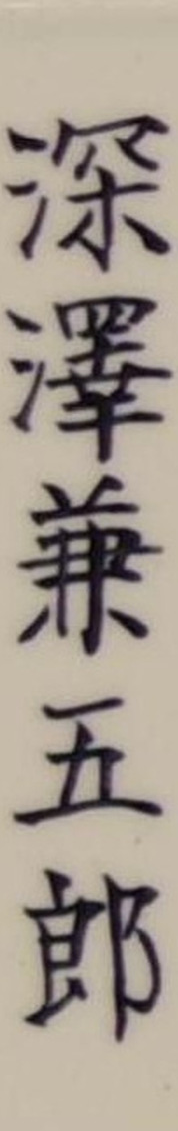深澤兼五郎
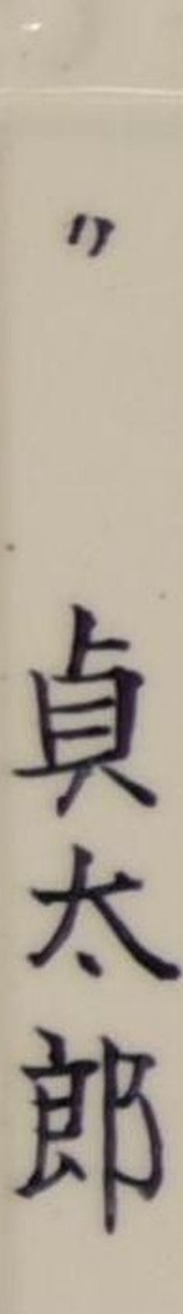貞太郎
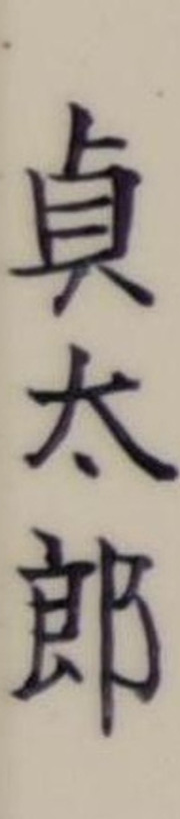貞太郎

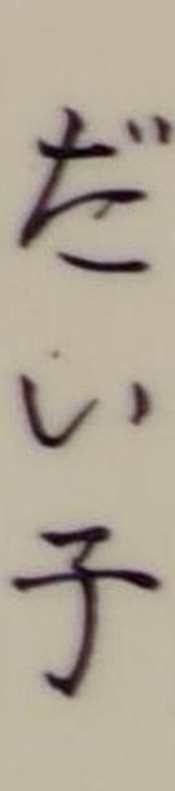だい子
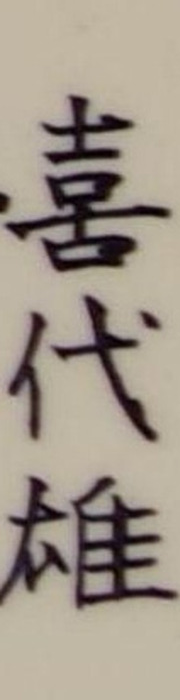喜代雄
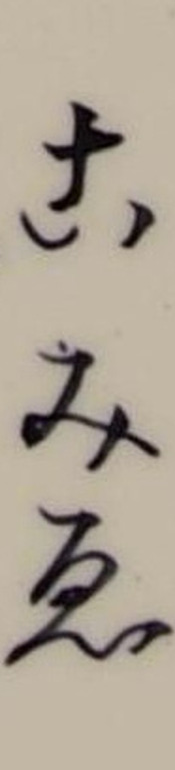こみえ
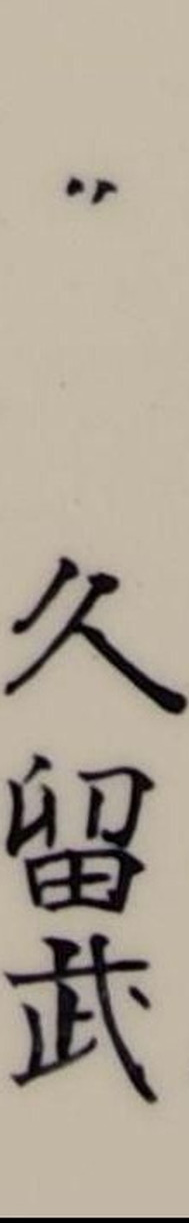久留武
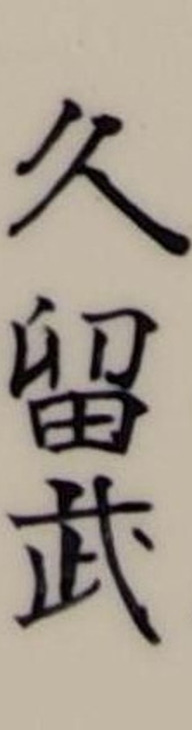久留武
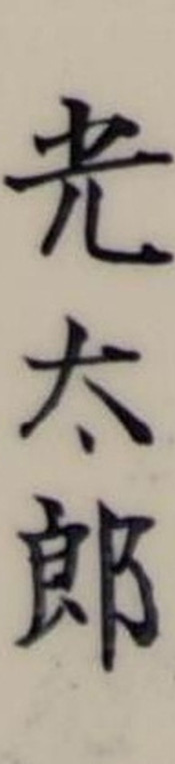光太郎
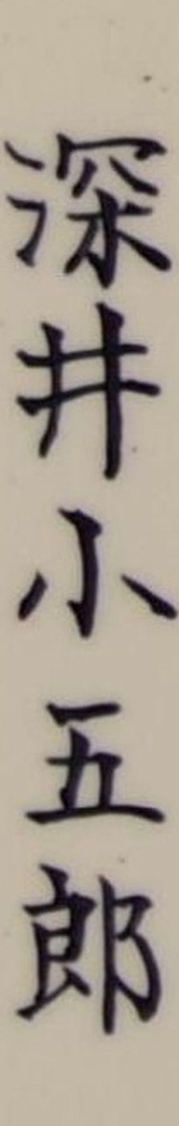深井小五郎
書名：E~L
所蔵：高野山金剛峯寺
